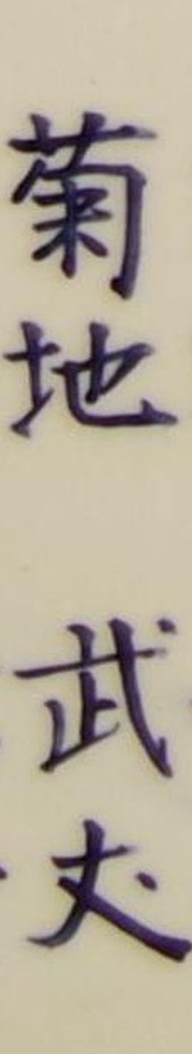菊地武丈
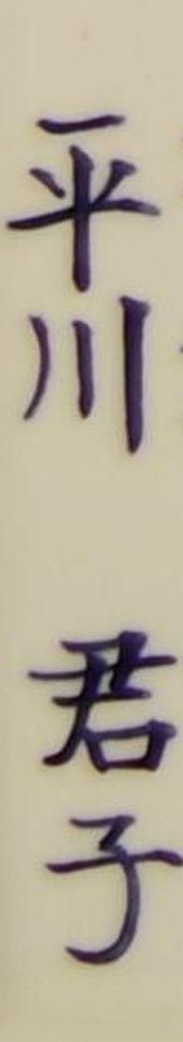平川君子

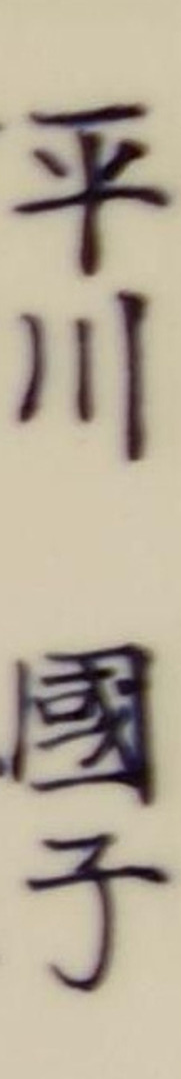平川國子
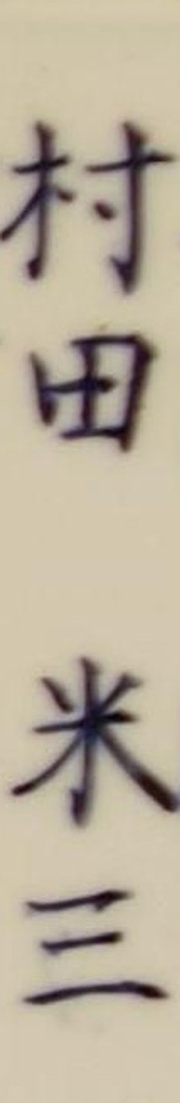村田米三
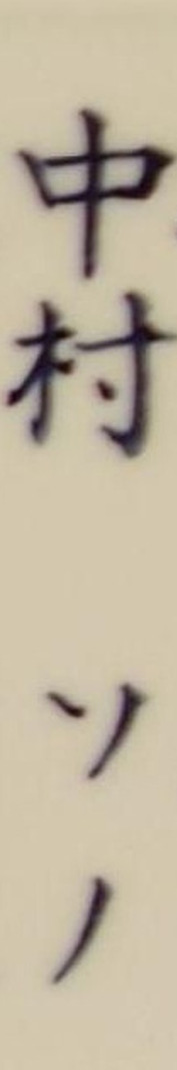中村ソノ
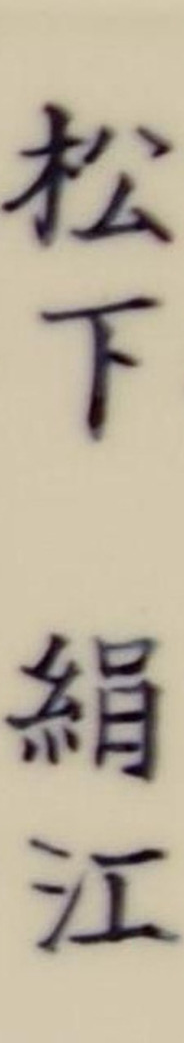松下絹江
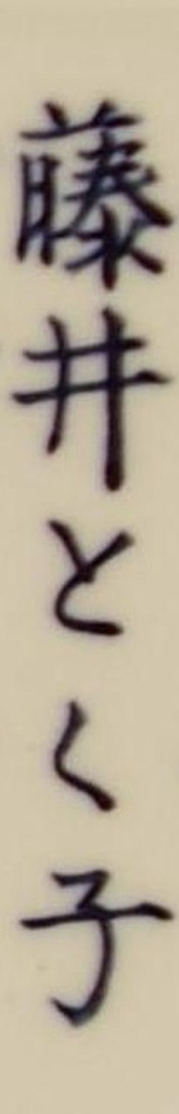藤井とく子
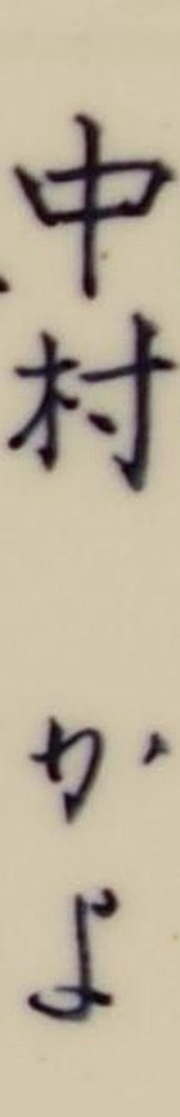中村かよ
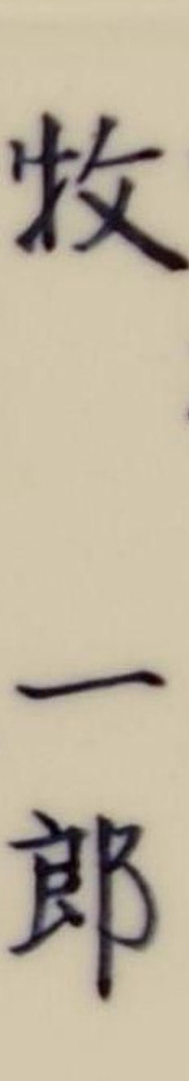牧一郎
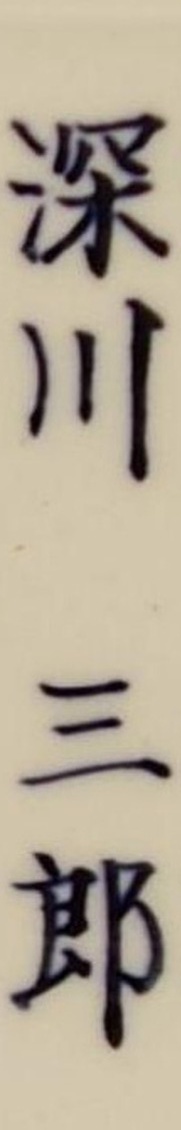深川三郎
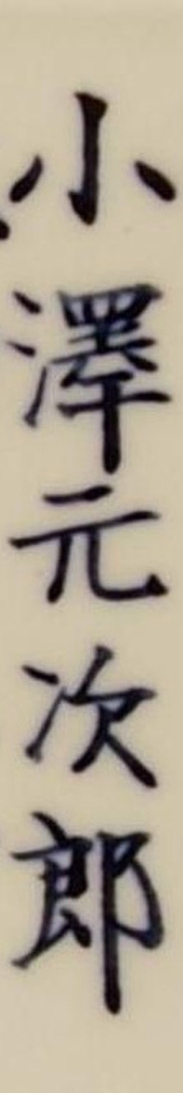小澤元次郎
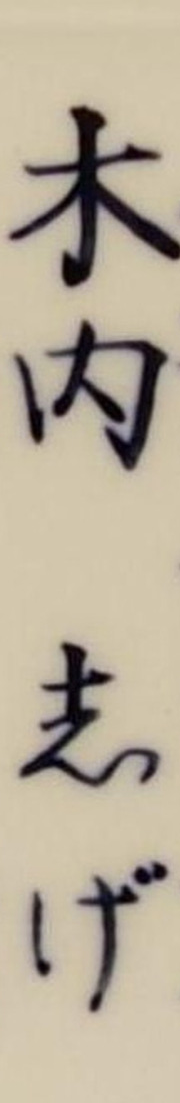木内しげ
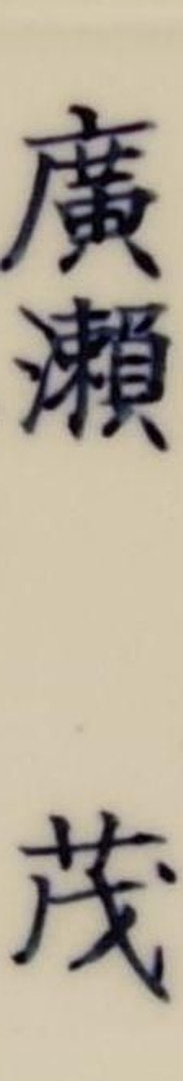広瀬茂
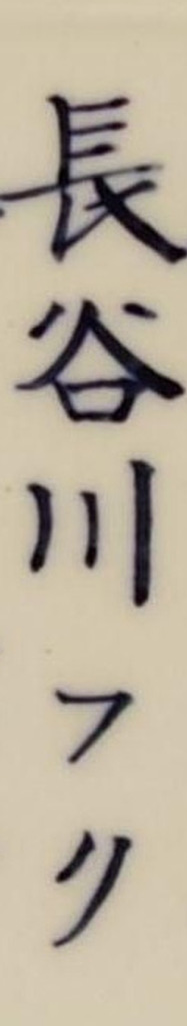長谷川フク
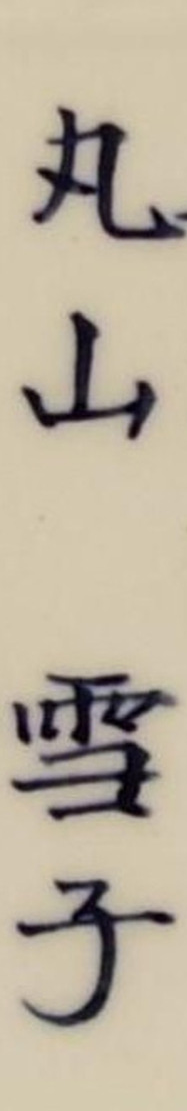丸山雪子
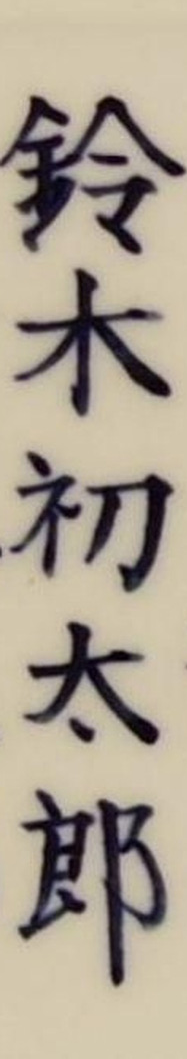鈴木初太郎
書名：E~L
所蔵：高野山金剛峯寺
